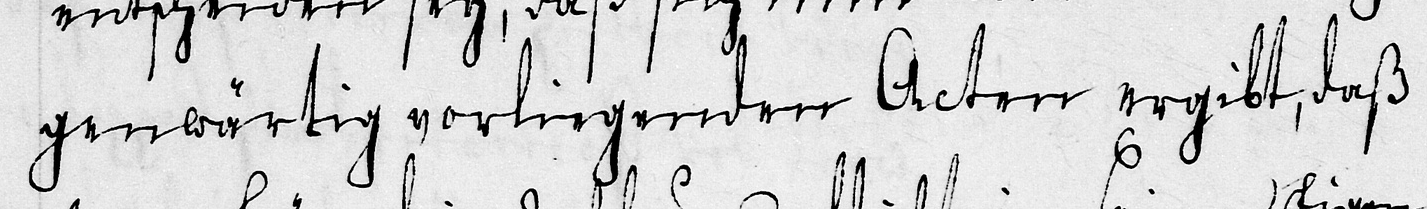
genwärtig vorliegenden Acten ergibt, daß
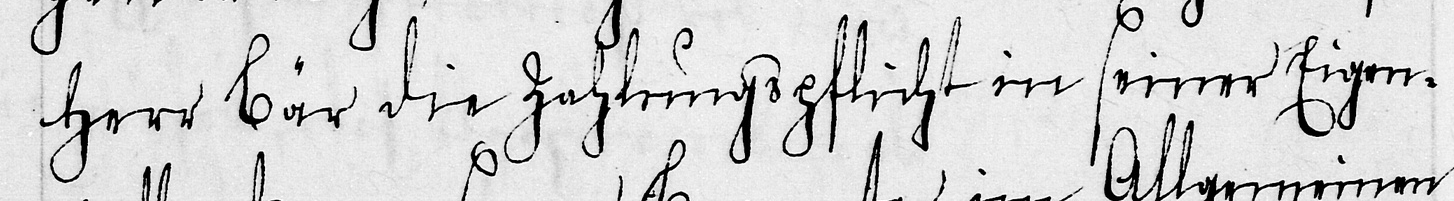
Herr Bär die Zahlungspflicht in seiner Eigen¬
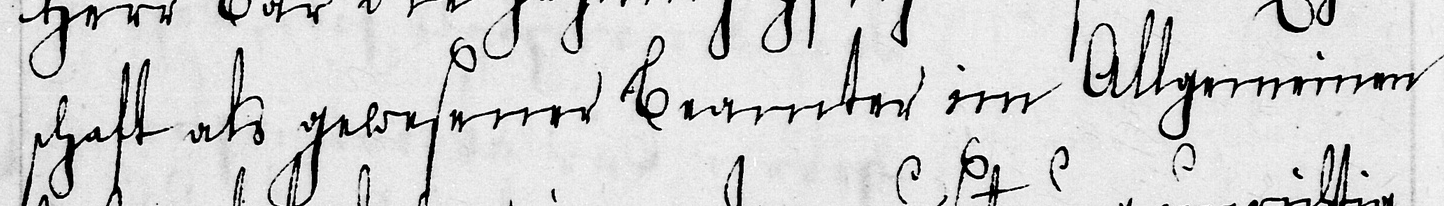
schaft als gewesener Beamter im Allgemeinen
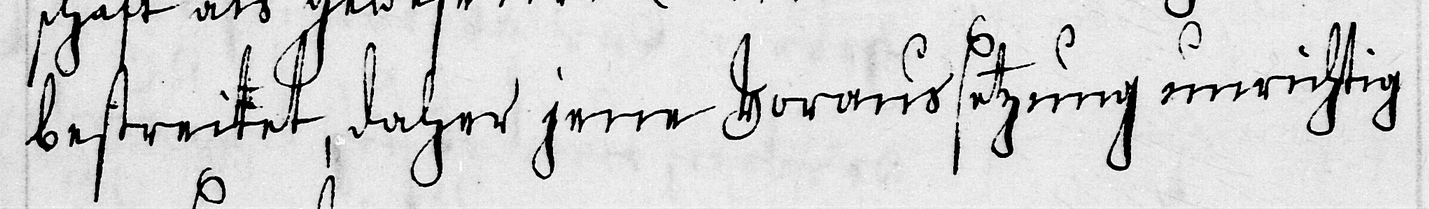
bestreitet, daher jene Voraussetzung unrichtig
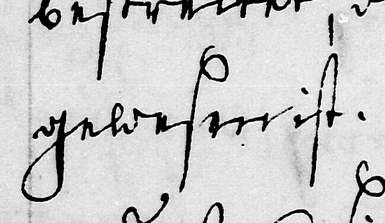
gewesen ist.
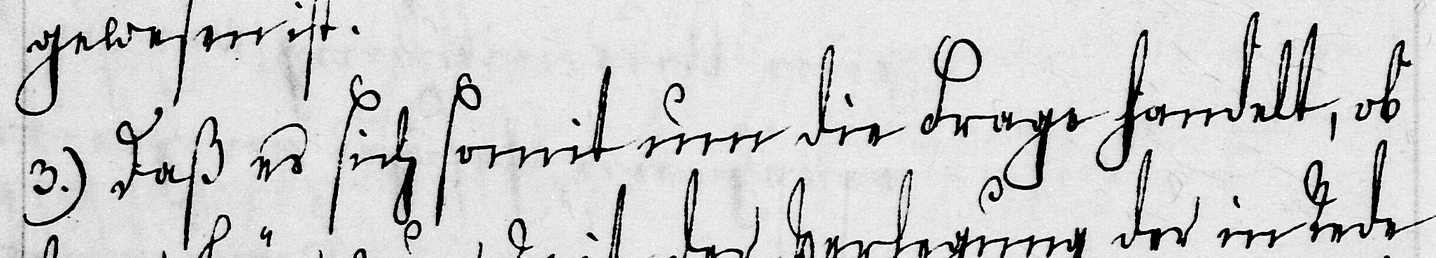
3.) Daß es sich somit um die Frage handelt, ob
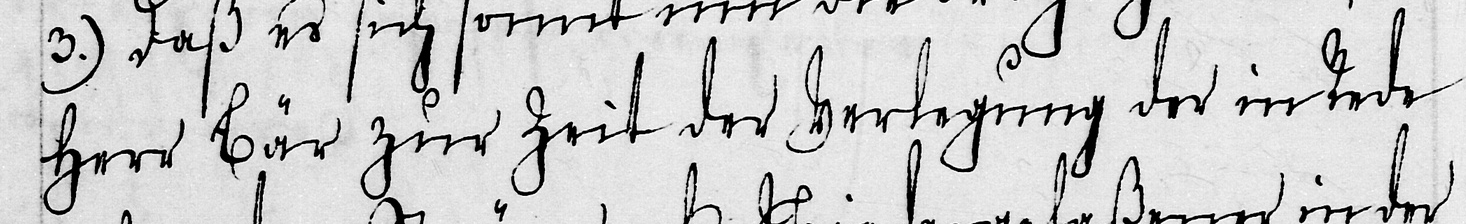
Herr Bär zur Zeit der Verlegung der in Rede
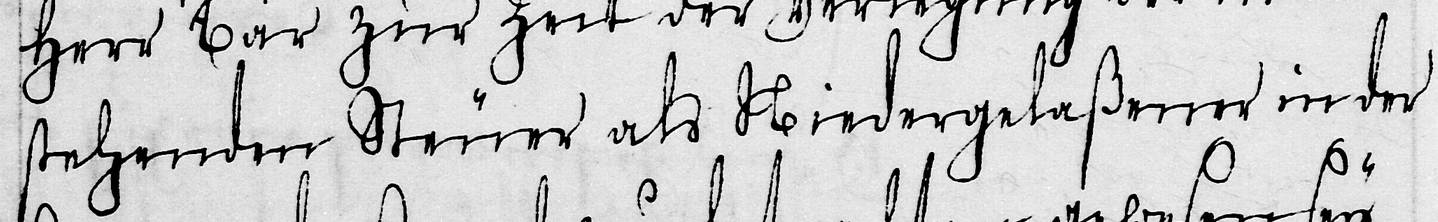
stehenden Steuer als Niedergelaßener in der
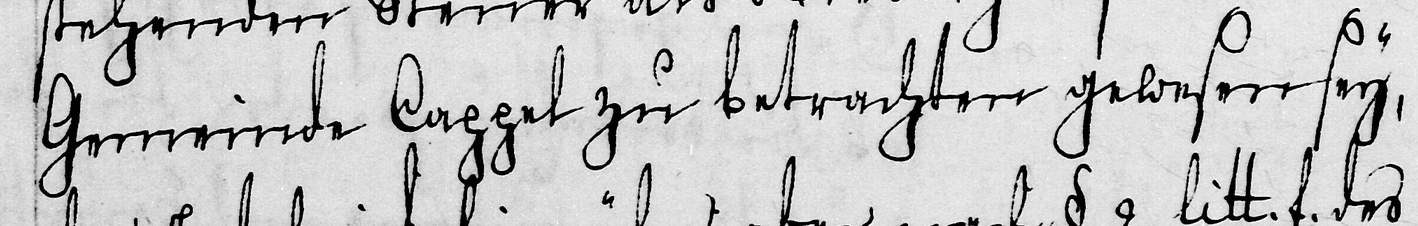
Gemeinde Cappel zu betrachten gewesen sey,
